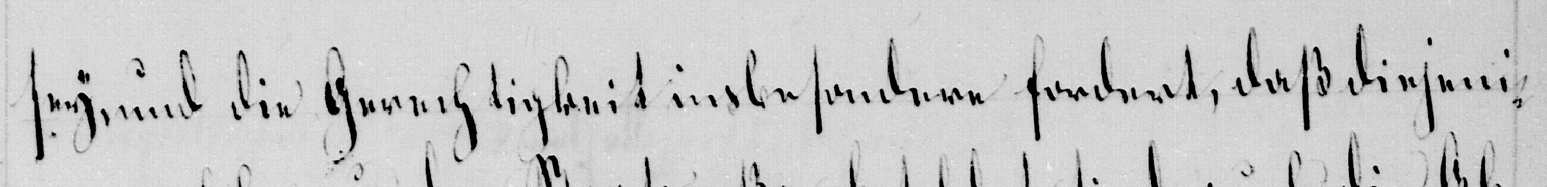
sey, und die Gerechtigkeit insbesondere fordert, daß diejeni¬
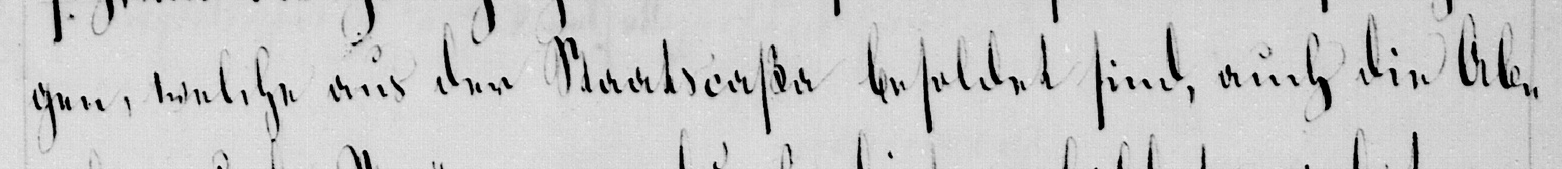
gen, welche aus der Staatscaßa besoldet sind, auch die Ab¬
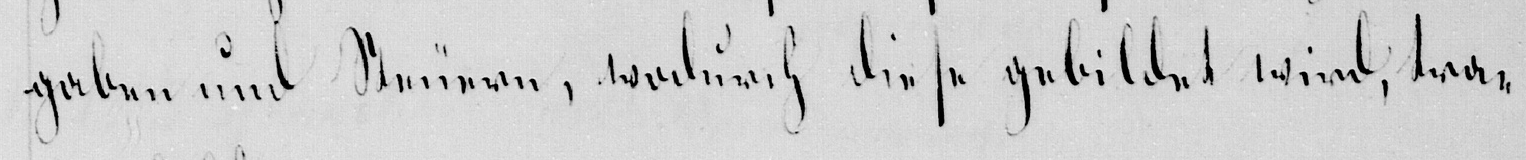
gaben und Steuern, wodurch diese gebildet wird, tra¬
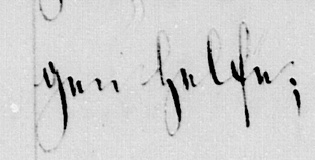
gen helfe;
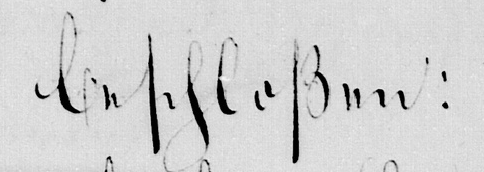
beschloßen:
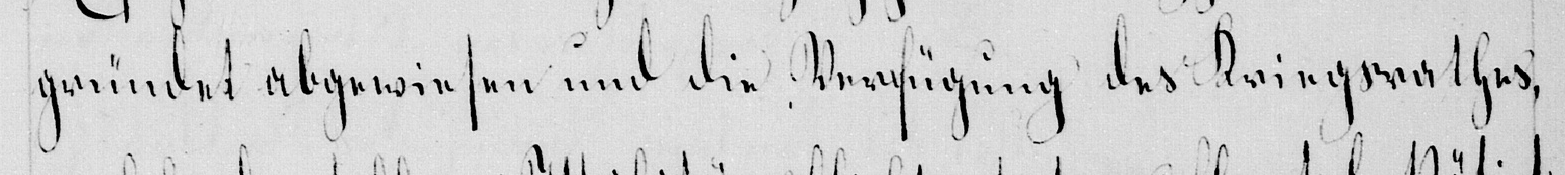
gründet abgewiesen und die Verfügung des Kriegsrathes,
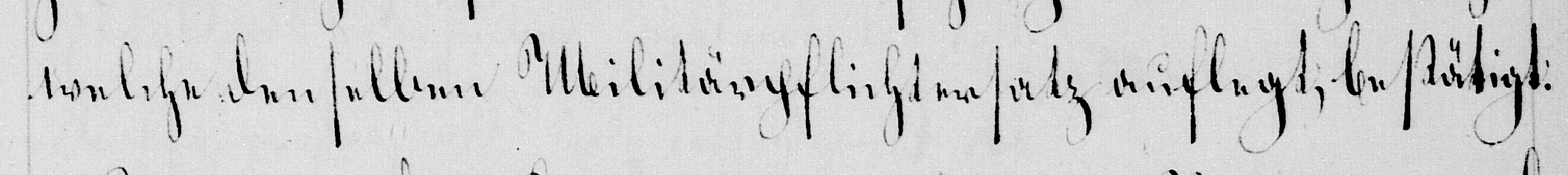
welche denselben Militärpflichtersatz auflegt, bestätigt.
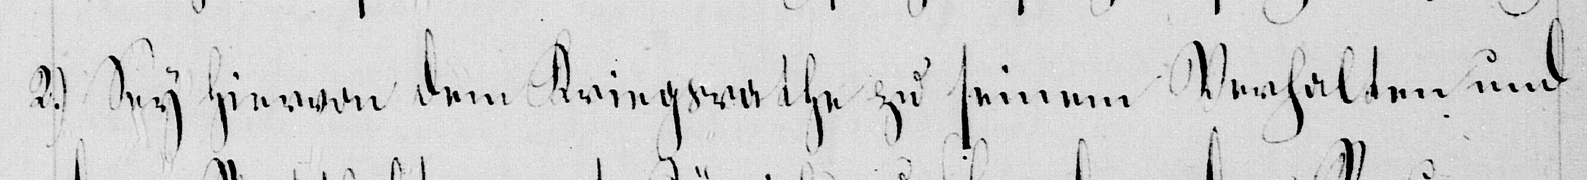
2.) Sey hiervon dem Kriegsrathe zu seinem Verhalten und
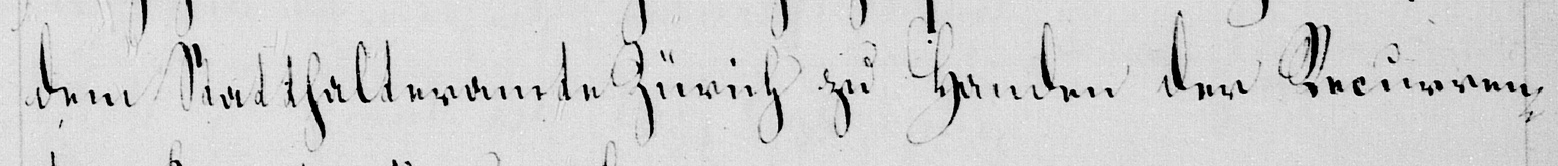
dem Statthalteramte Zürich zu Handen der Recurren¬
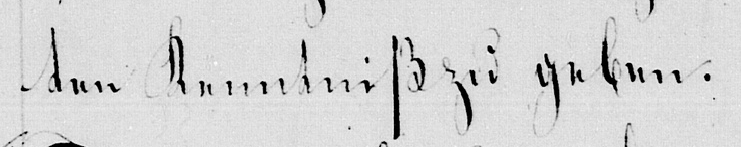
ten Kenntniß zu geben.
